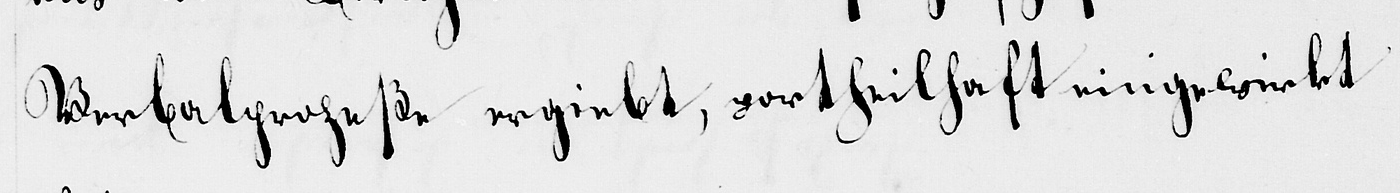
Verbalprozeße ergiebt, vortheilhaft eingewirkt
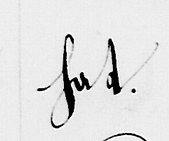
hat.
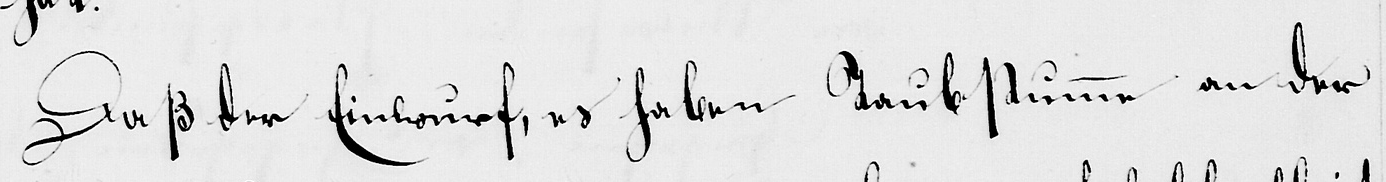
Daß der Einwurf, es haben Taubstumme an der
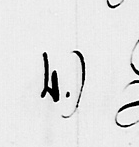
4.)
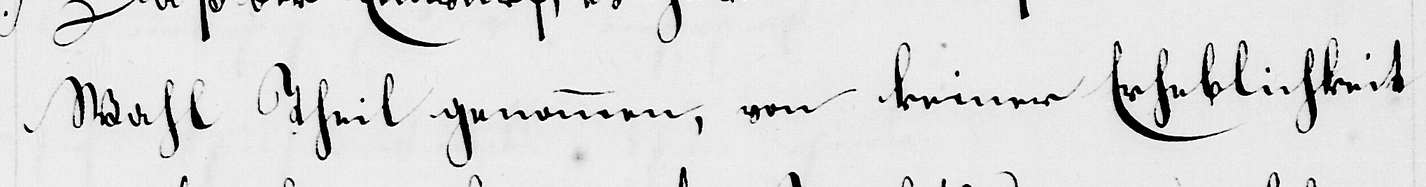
Wahl Theil genommen, von keiner Erheblichkeit
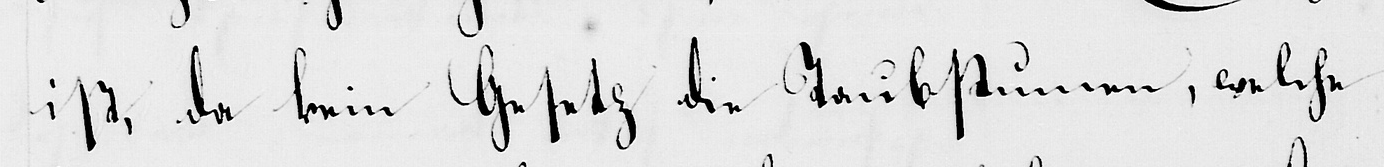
ist, da kein Gesetz die Taubstummen, welche
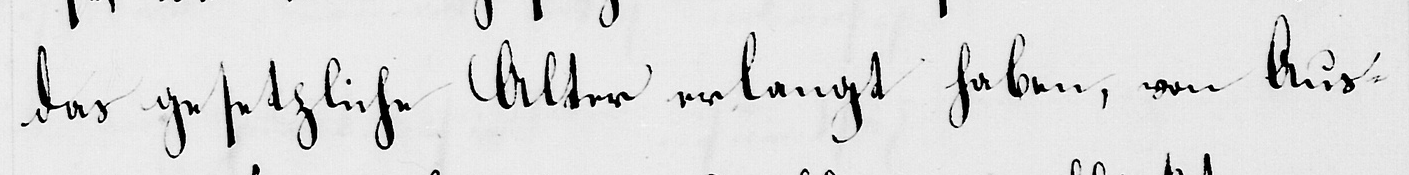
das gesetzliche Alter erlangt haben, von Aus¬
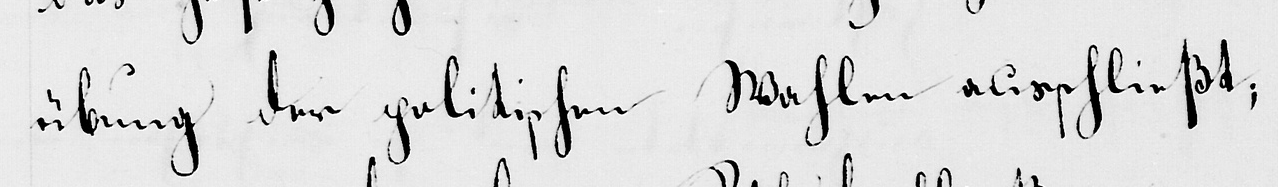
übung der politischen Wahlen ausschließt;
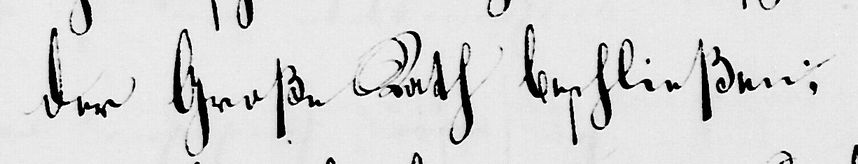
der Große Rath beschließen;
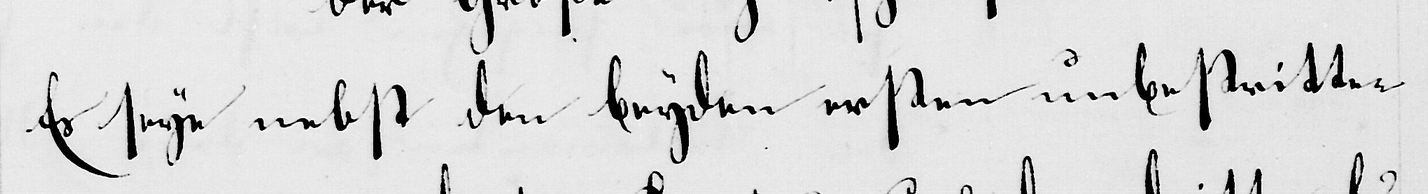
Es seye nebst den beyden ersten unbestritte¬
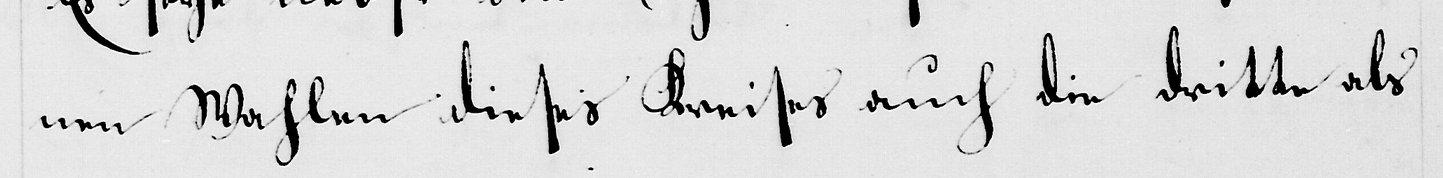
nen Wahlen dieses Kreises auch die dritte als
